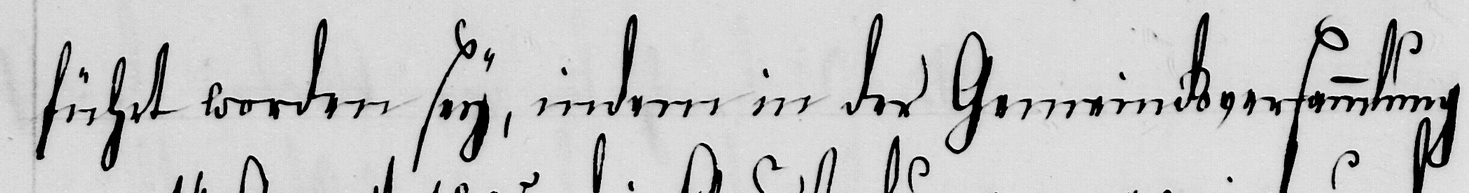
führt worden sey, indem in der Gemeindsversammlu¬
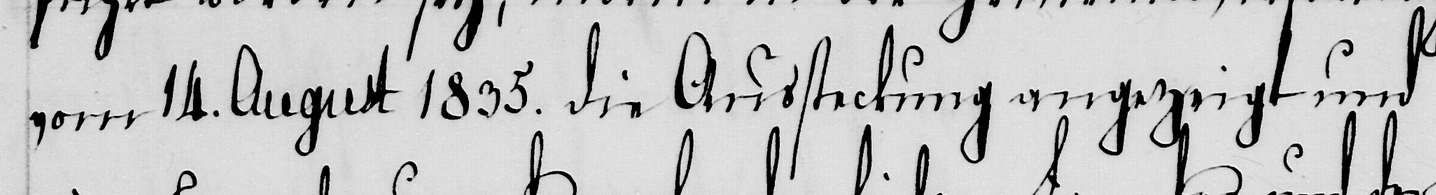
vom 14. August 1835. die Aussteckung angezeigt und
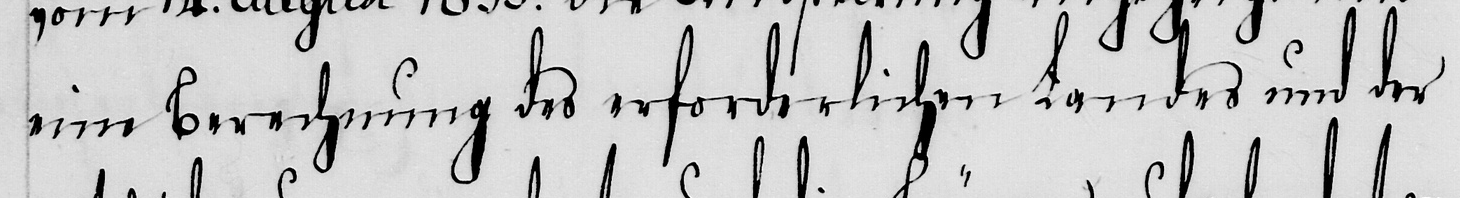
eine Berechnung des erforderlichen Landes und der
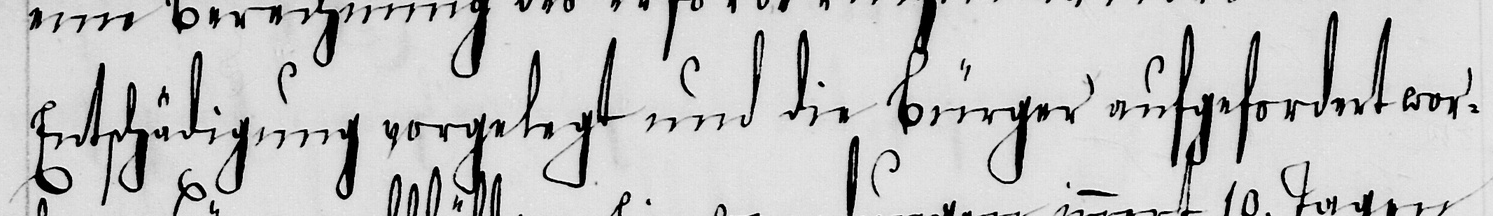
Entschädigung vorgelegt und die Bürger aufgefordert wo¬
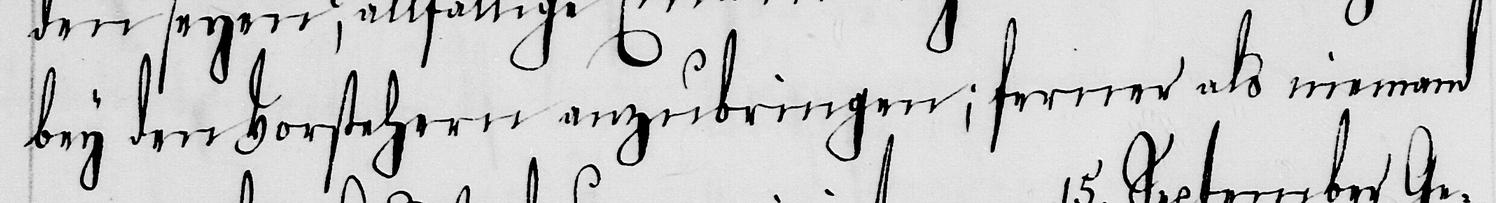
bey den Vorstehern anzubringen; ferner als niemand
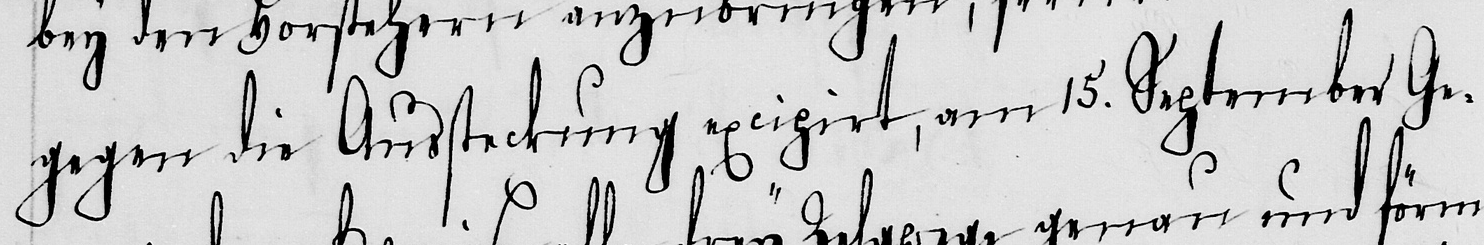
gegen die Aussteckung excipirt, am 15. September Ge¬
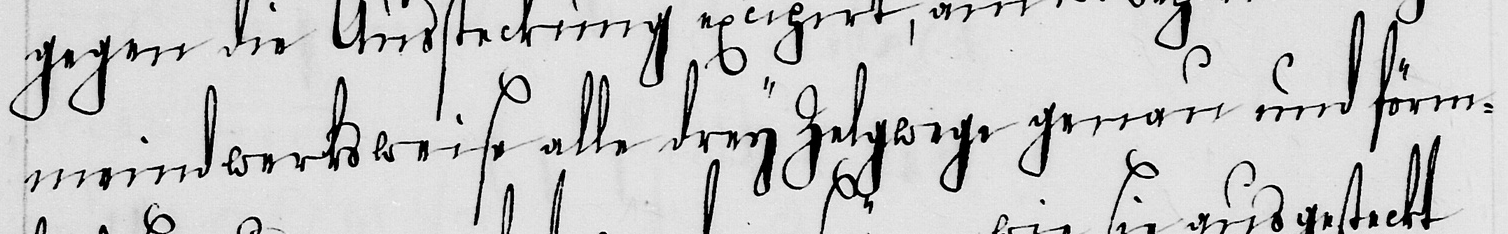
meindwerksweise alle drey Zelgwege genau und förm¬
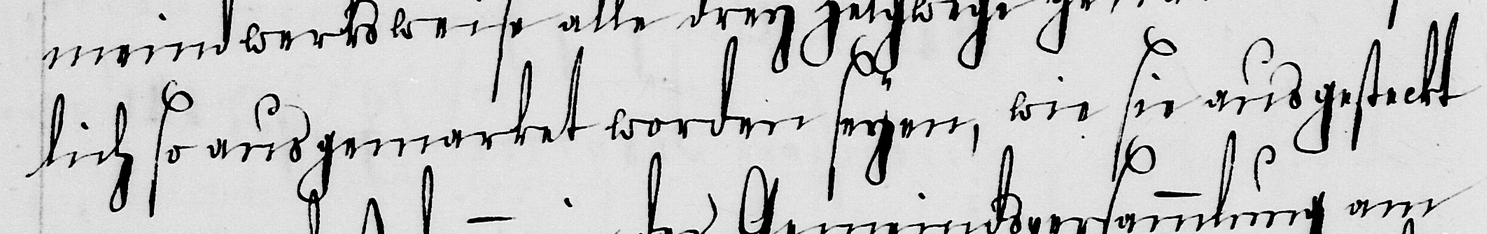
lich so ausgemarket worden seyen, wie sie ausgesteckt
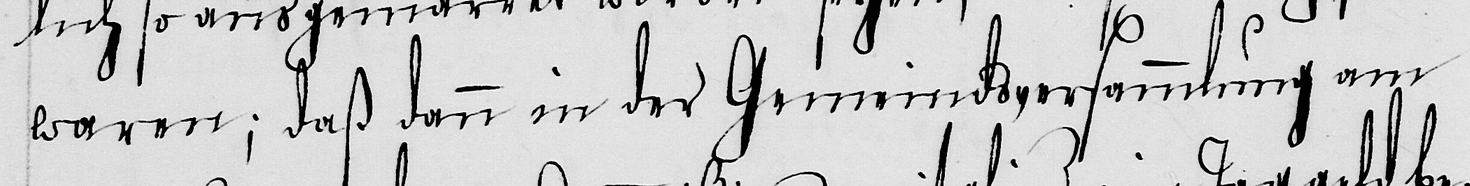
waren; daß dann in der Gemeindsversammlung am
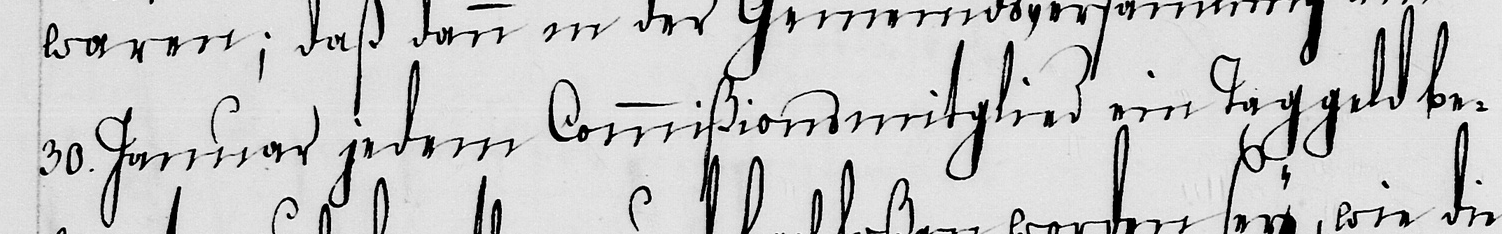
30. Januar jedem Commißionsmitglied ein Taggeld bes¬
